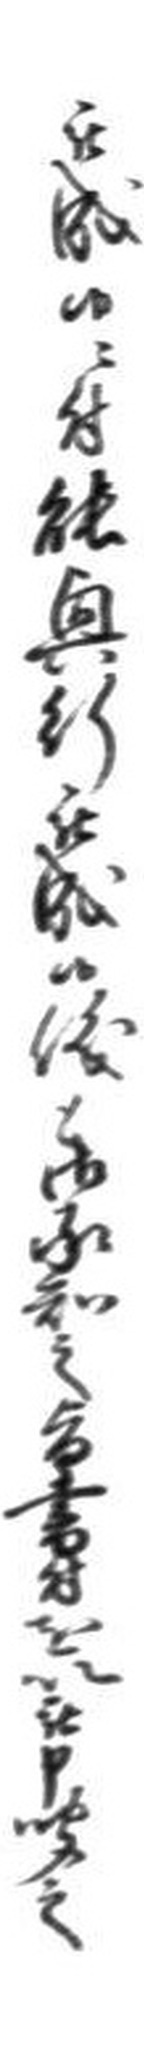被成候ニ付能興行被成候儀も御承知之旨書付を以被申聞之
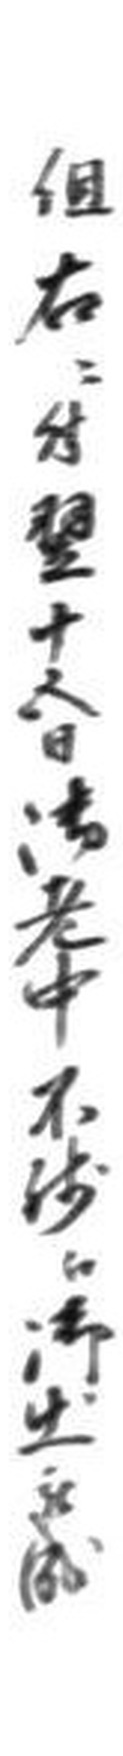但右ニ付翌十五日御老中不残江御出被成
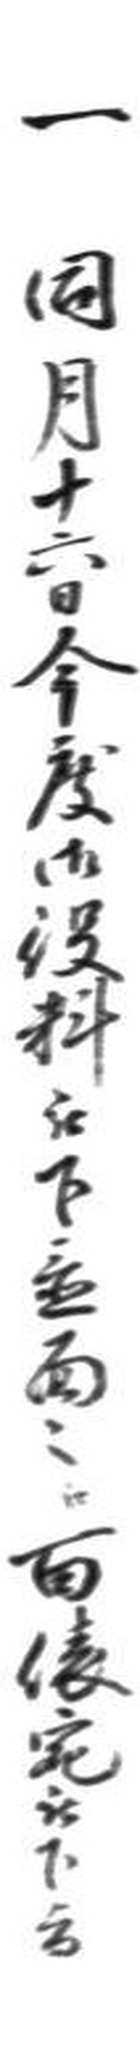一同月十六日今度御役料被下置面々江百俵宛被下旨

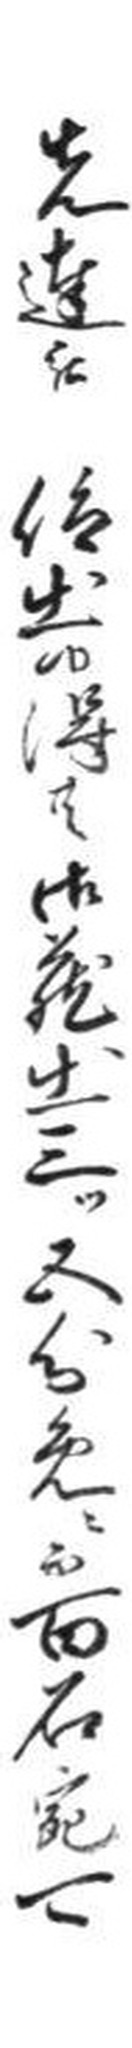先達被仰出候得共御蔵出三ツ五分免ニ而百石宛可
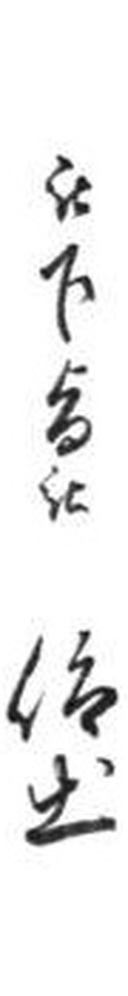被下旨被仰出
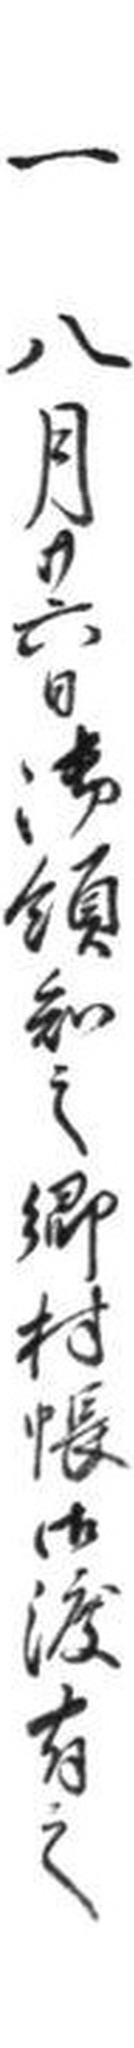一八月廿六日御領知之郷村帳御渡有之
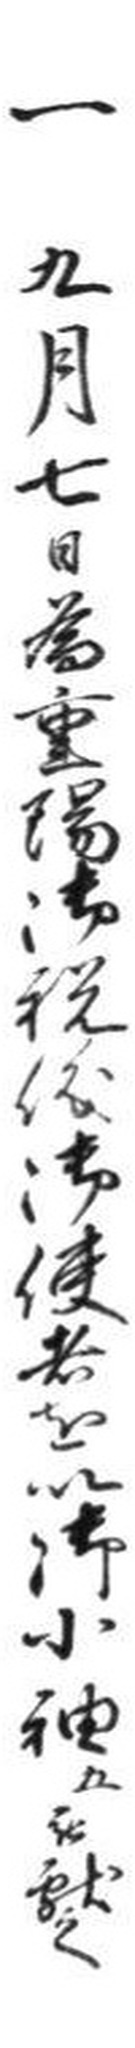一九月七日為重陽御祝儀御使者を以御小袖五被献之
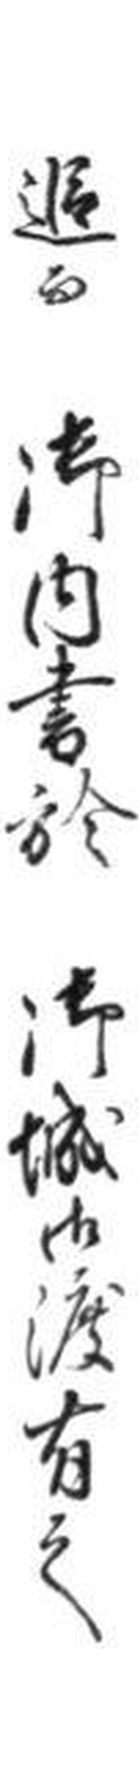追而御内書於御城御渡有之
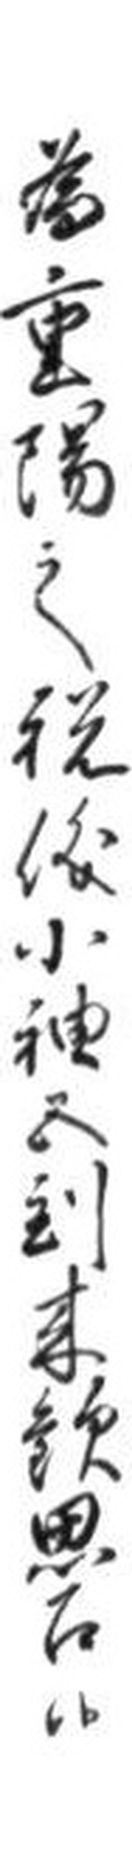為重陽之御祝儀小袖五到来歓思候
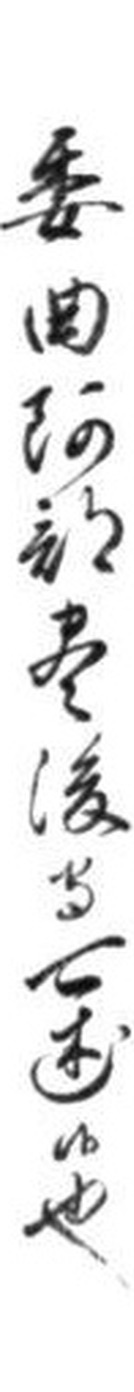委曲阿部豊後守可述候也
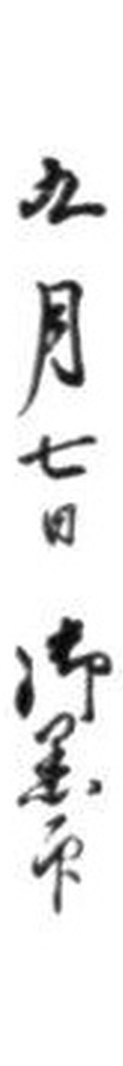五月七日御墨印
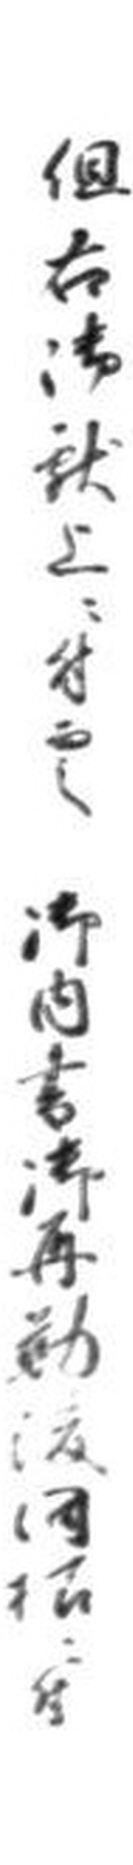但右御献上ニ付而之御内書御再勤後同断ニ付
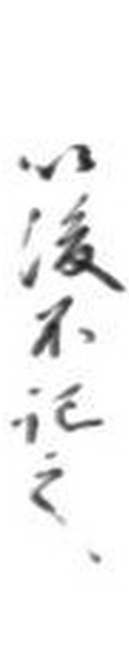以後不記之
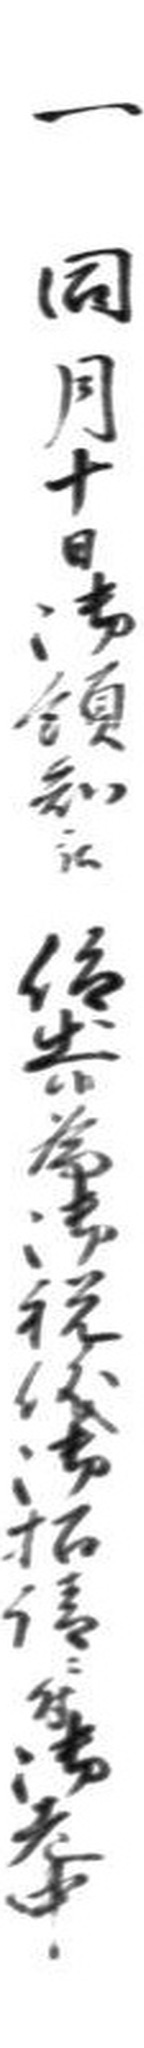一同月十日御領知被仰出候為御祝儀御招請ニ付御老中
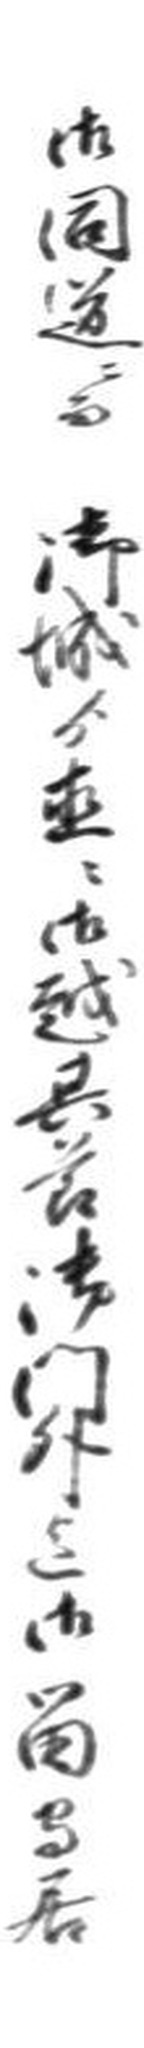御同道ニ而御城ゟ直々ニ御越節御門外迄御留守居
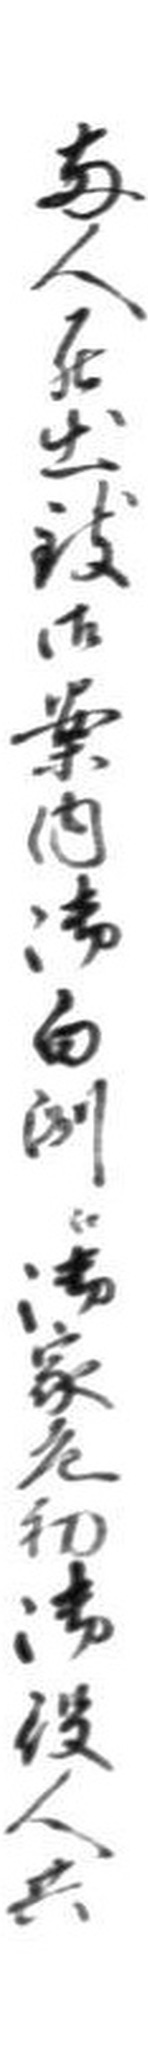両人罷出致御案内御白洲江御家老初御役人共
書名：家譜 十六 吉品公 従貞享三年閏三月到同四年
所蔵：福井県文書館 Fukui Prefectural Archives
